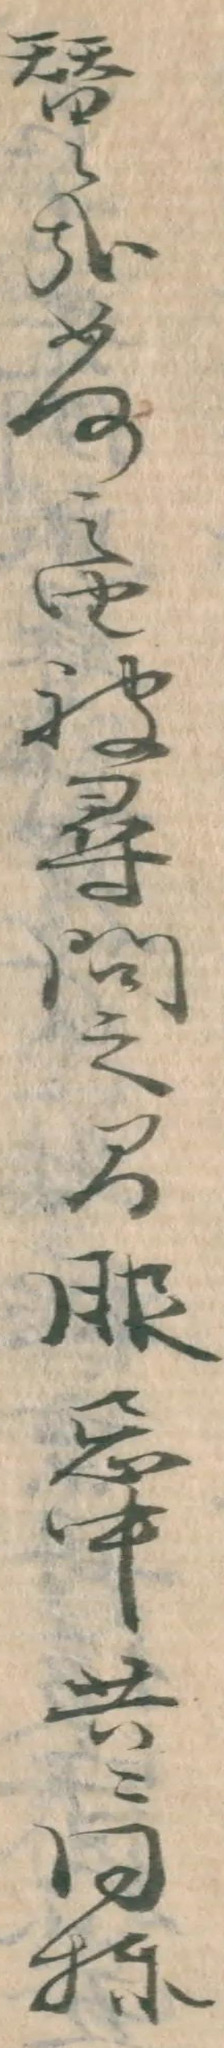替候哉如何之由被尋問之間服忌中共ニ同様
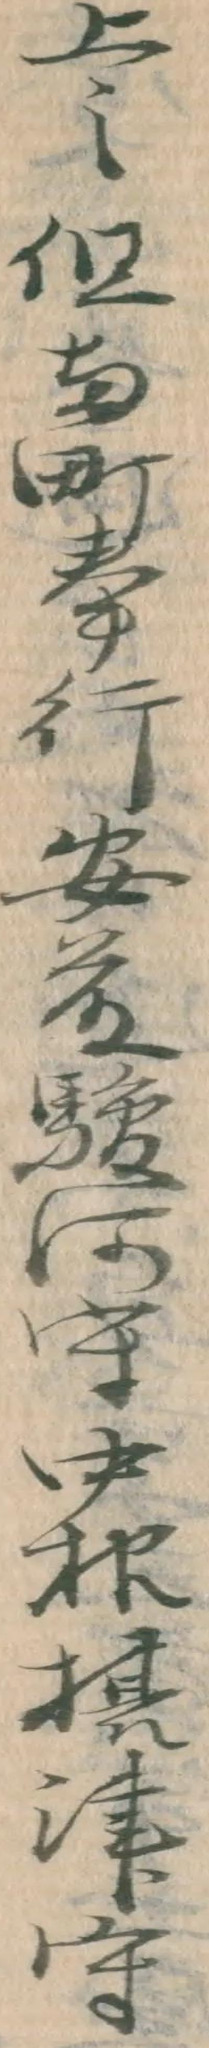上之但両町奉行安藤駿河守中根摂津守
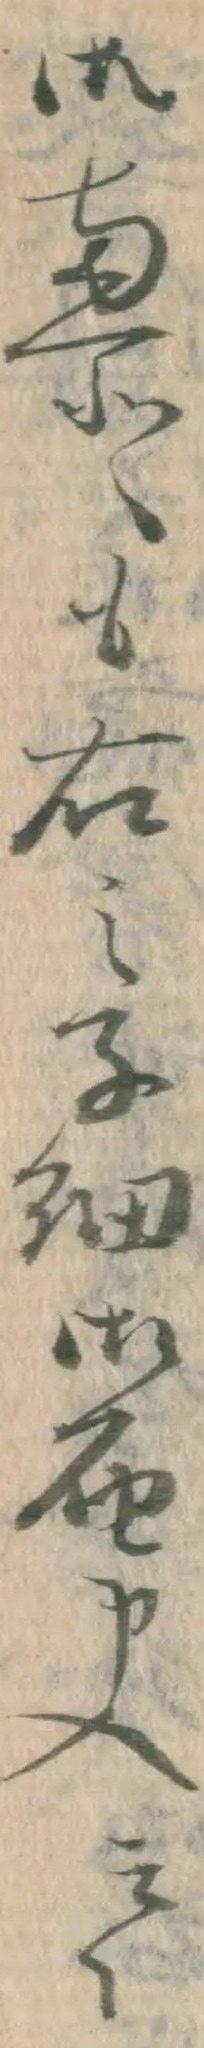御両所へも右之子細御届申入云々
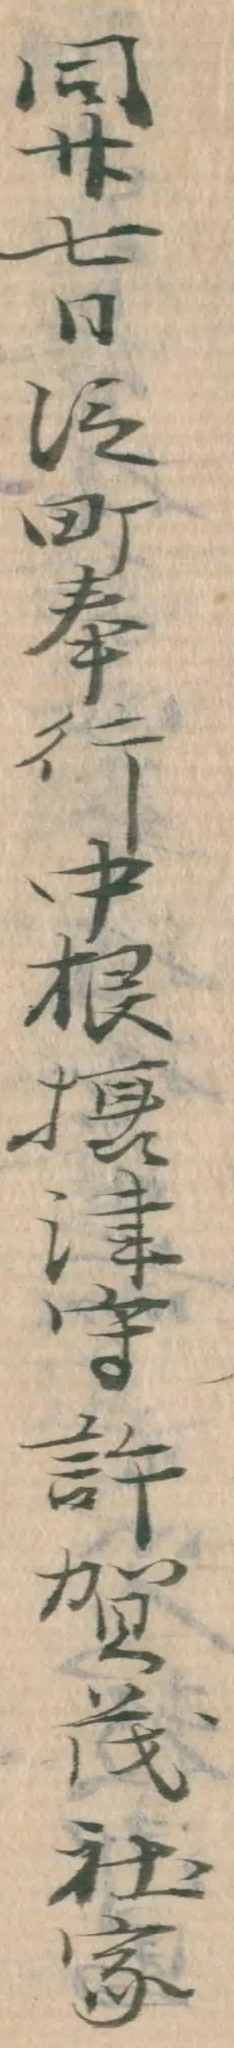同廿七日従町奉行中根摂津守許賀茂社家
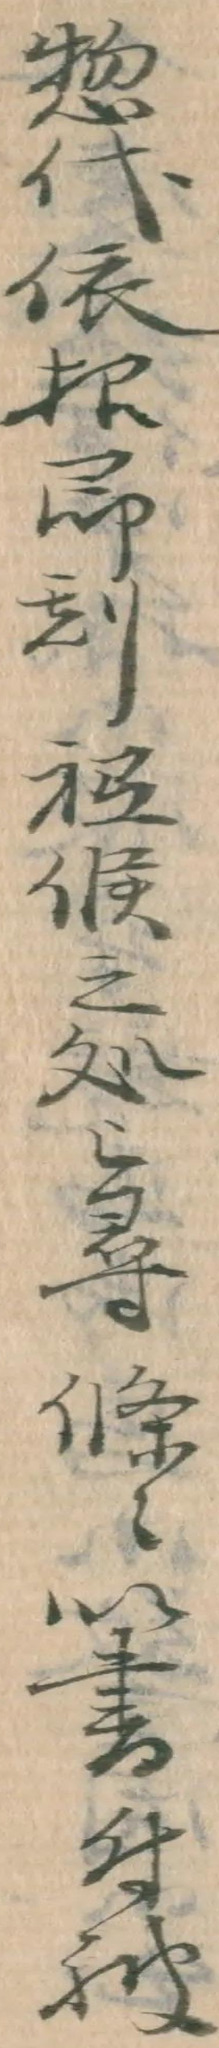惣代依招即刻祝候之処被尋条々以書付被
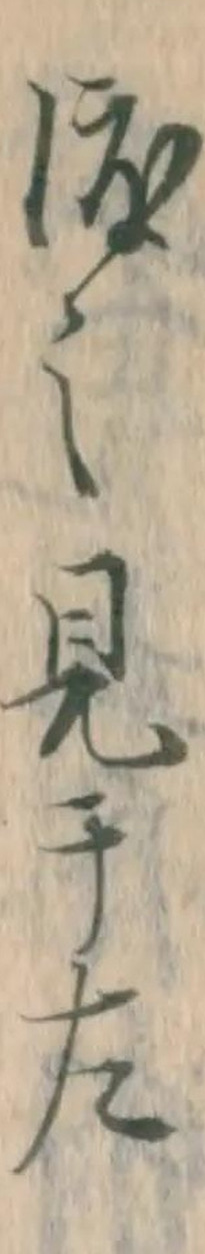渡之見于左
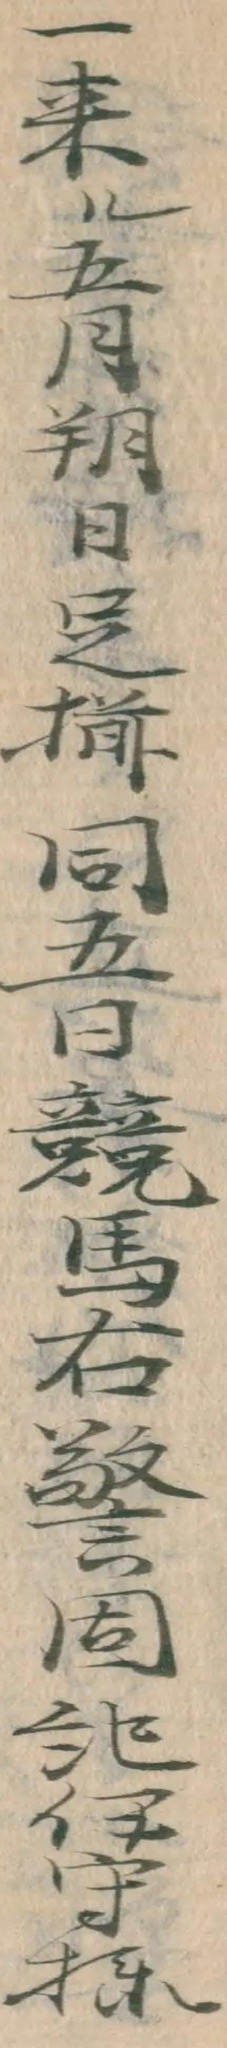一来ル五月朔日足揃同五日競馬右警固紀伊守様
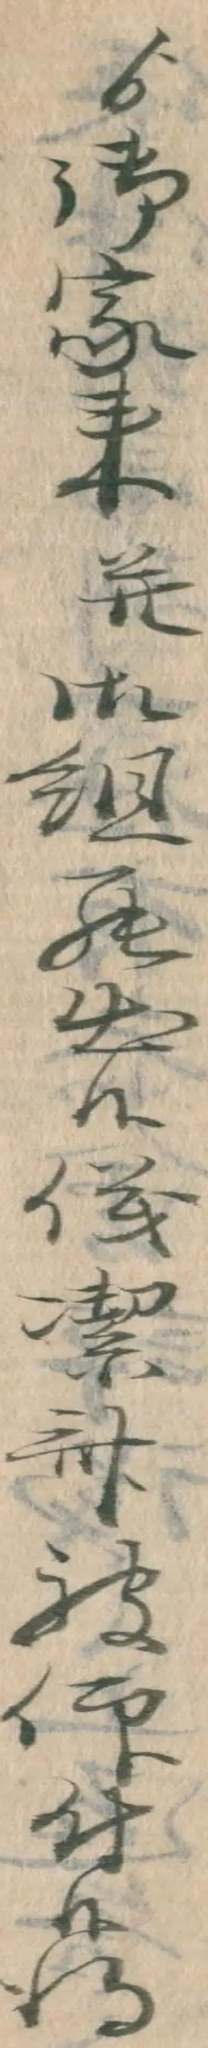ゟ御家来并御組罷出候儀潔斎被仰付候得
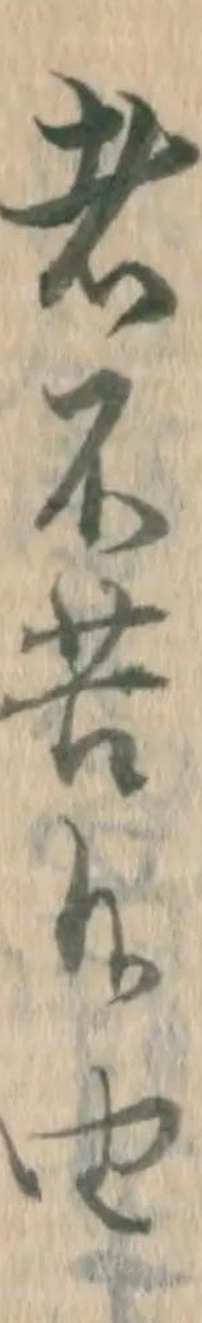者不苦候由
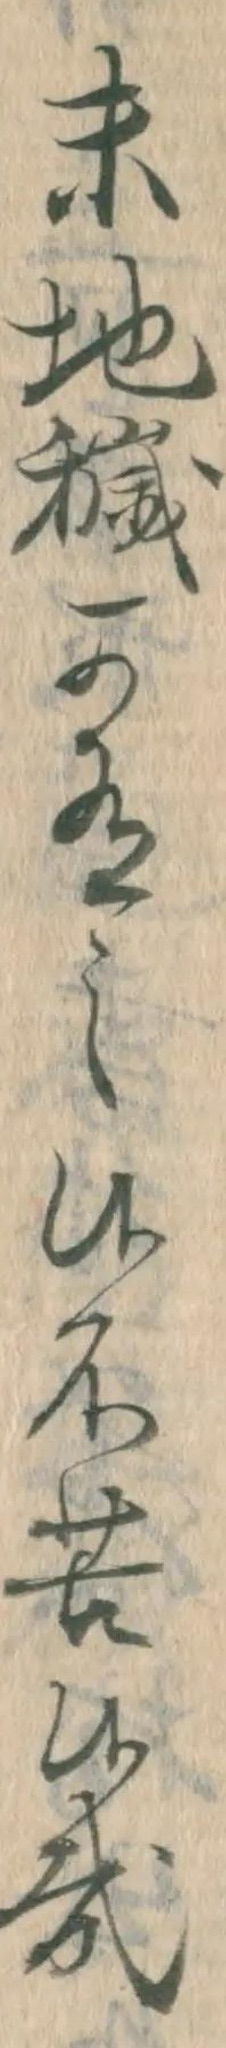未地穢可有之候不苦候哉
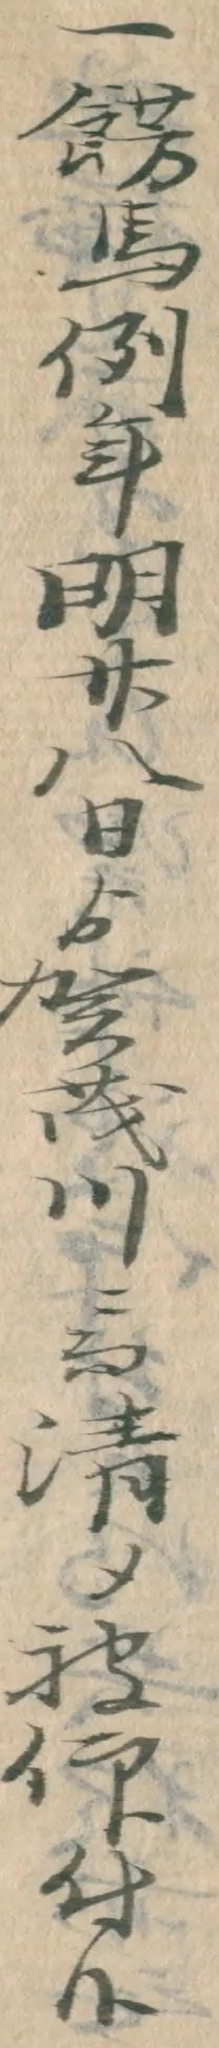一餝馬例年明廿八日ゟ賀茂川ニ而清メ被仰付候
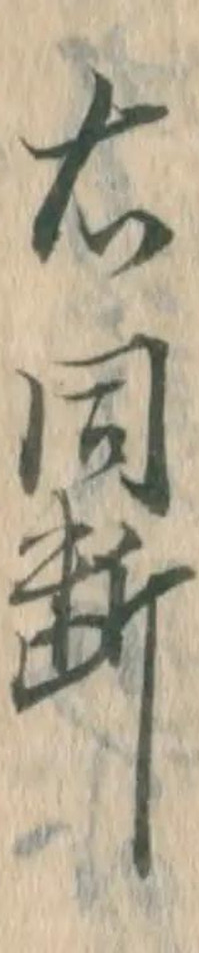右同断
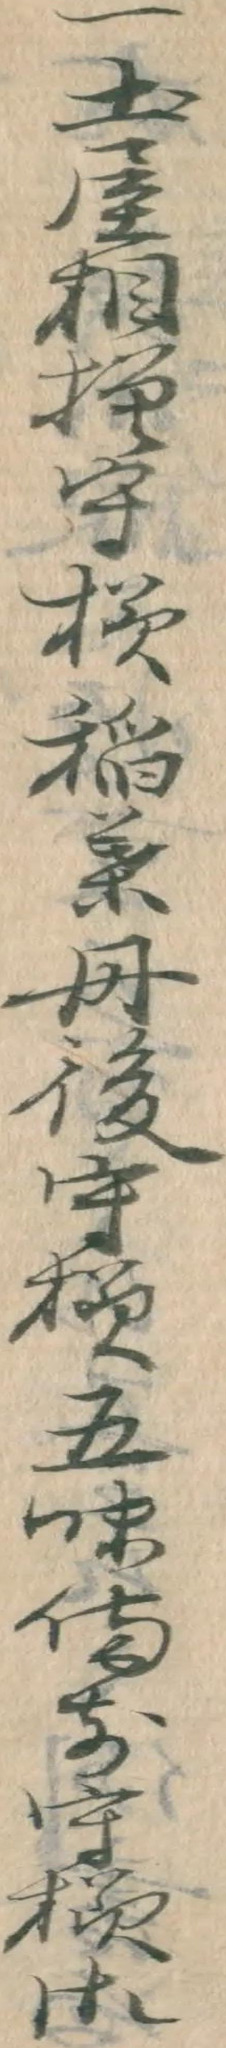一土屋相模守様稲葉丹後守様五味備前守様御
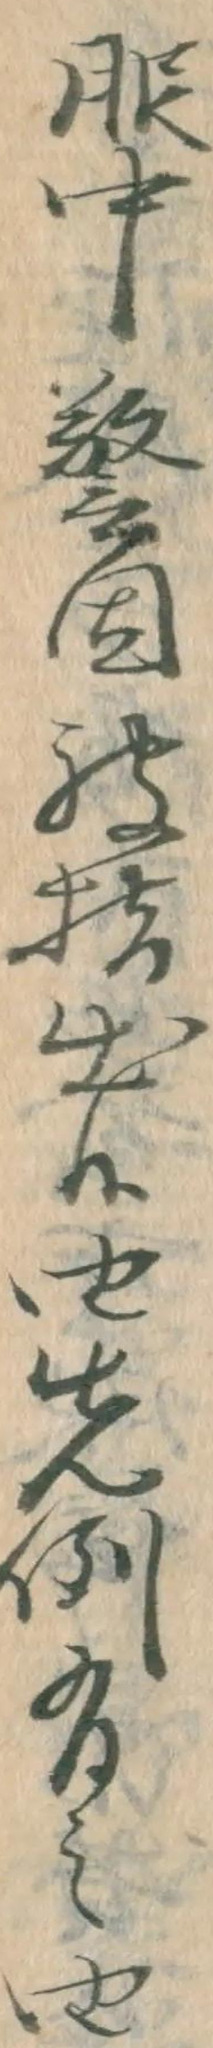服中警固被指出候由先例有之由

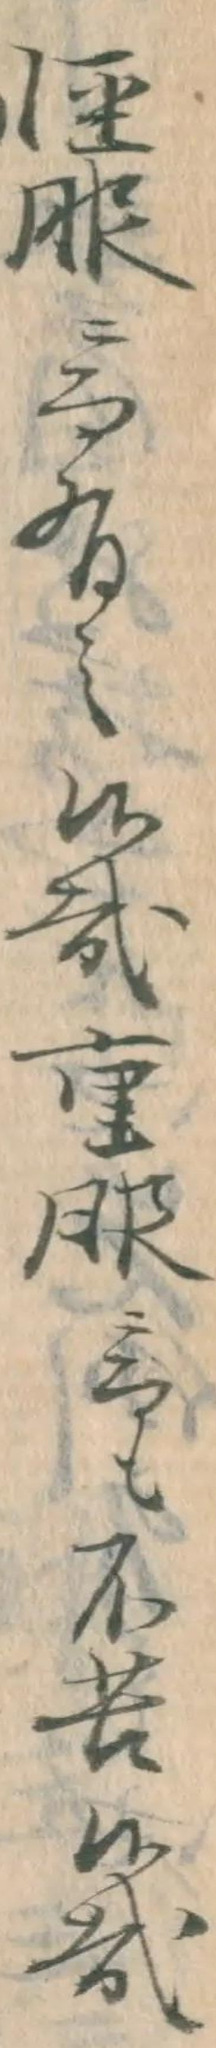軽服ニ而有之候哉重服ニ而も不苦候哉
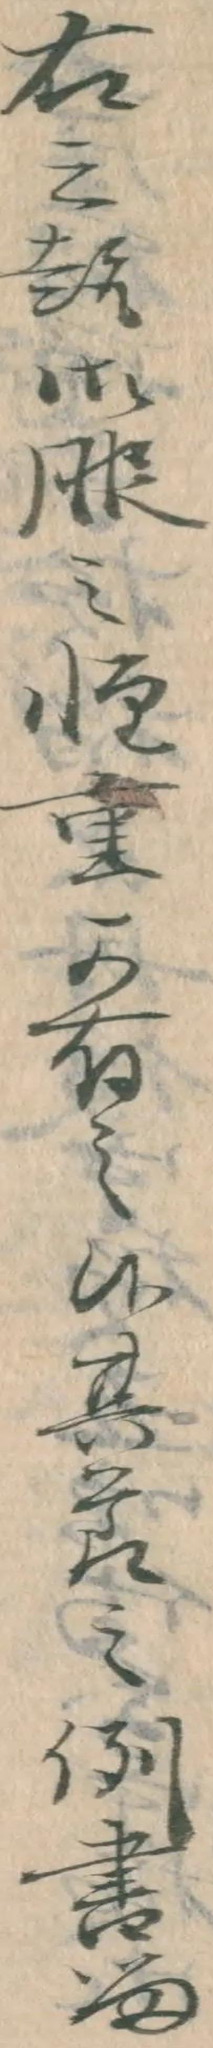右之趣御服之軽重可有之候其節之例書留
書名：賀茂社記録. 第10冊
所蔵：国立国会図書館 National Diet Library, JAPAN
